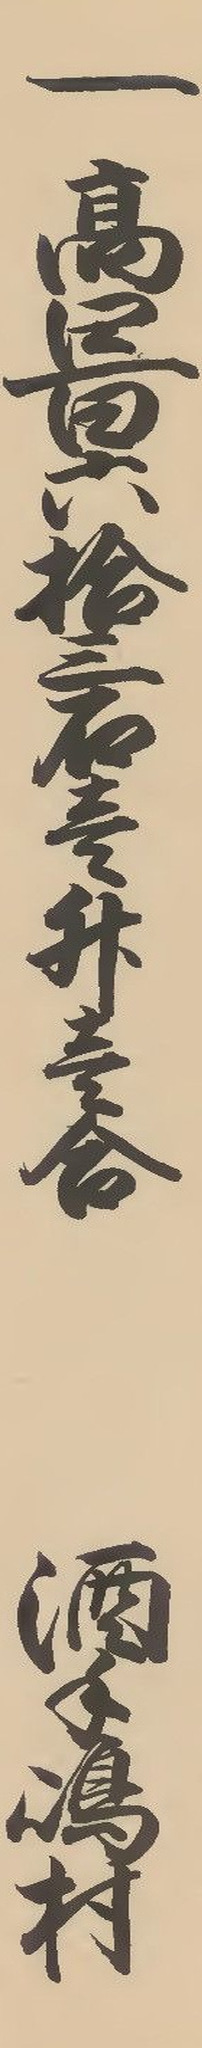一高四百六拾三石壱升壱合酒手島村
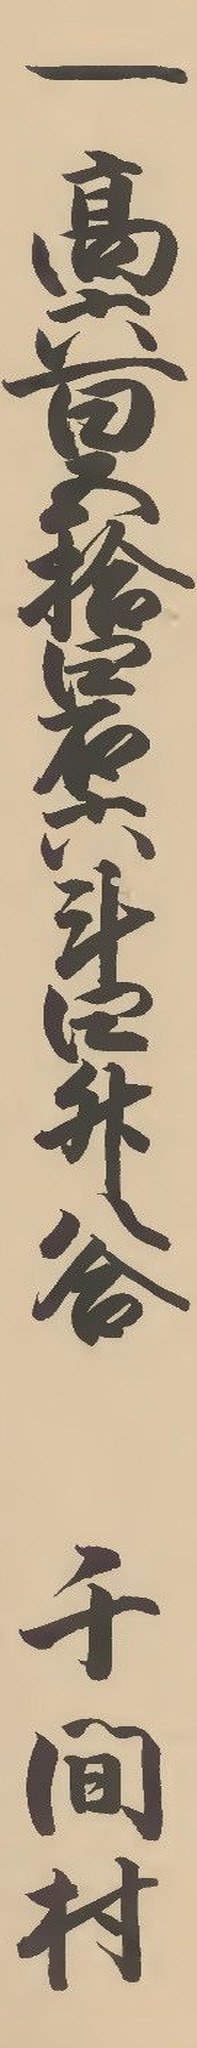一高六百五拾四石六斗四升八合千間村
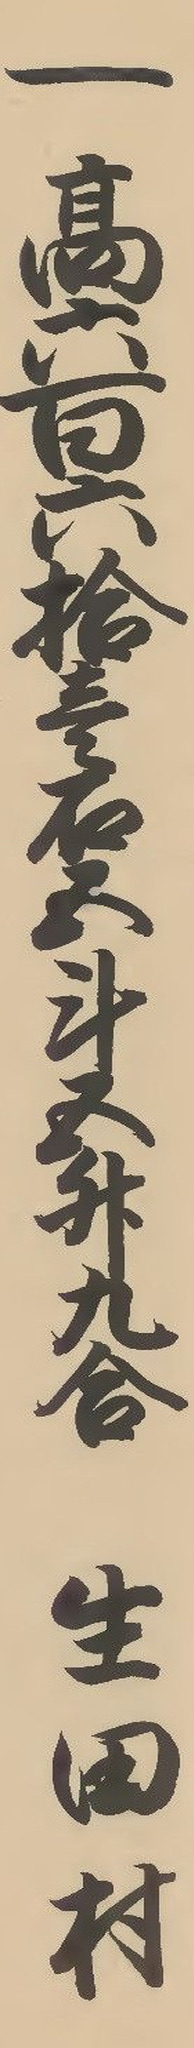一高六百六拾壱石五斗五升九合生田村
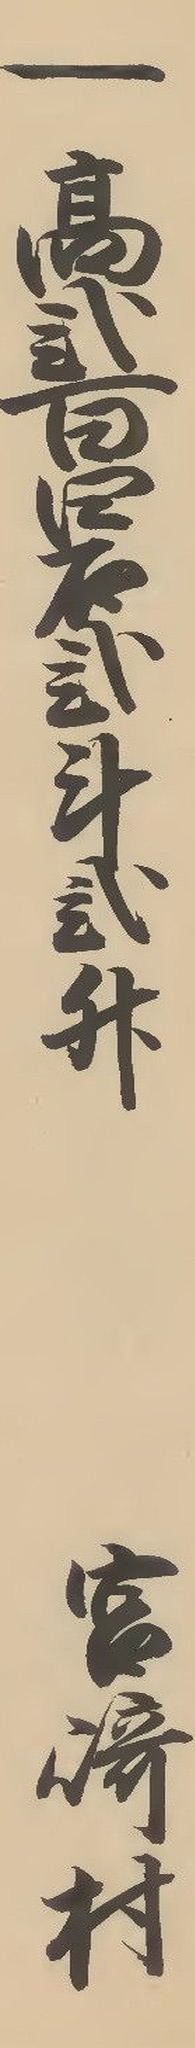一高弐百四石弐斗弐升宮崎村
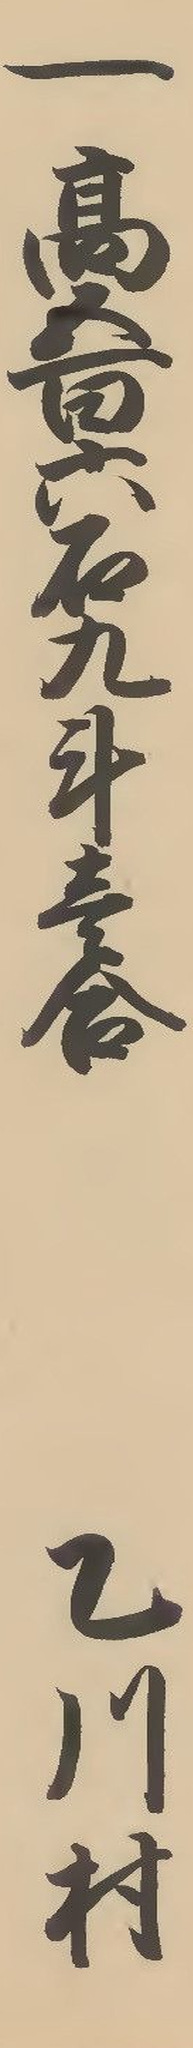一高五百六石九斗壱合乙川村
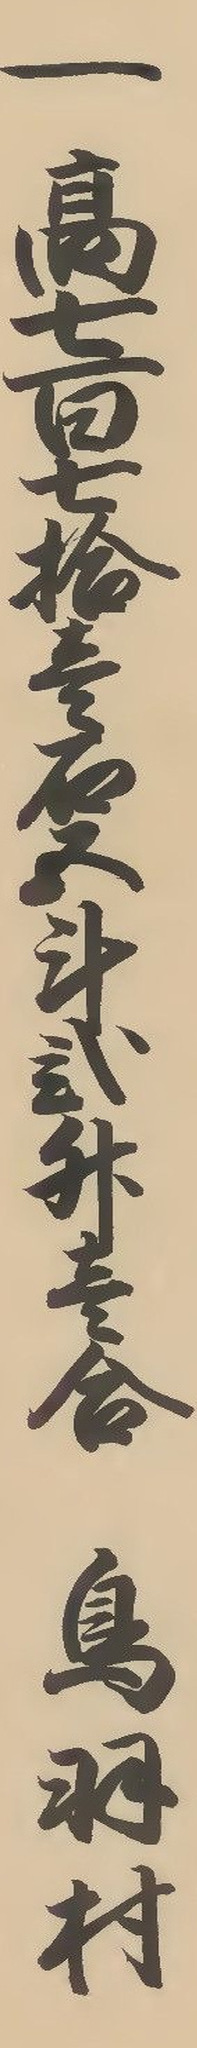一高七百七拾壱石五斗弐升壱合鳥羽村

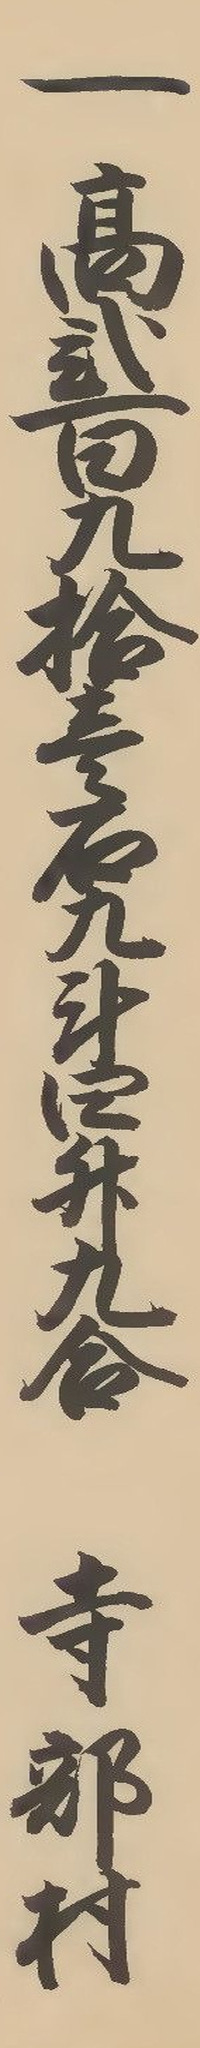一高弐百九拾壱石九斗四升九合寺部村
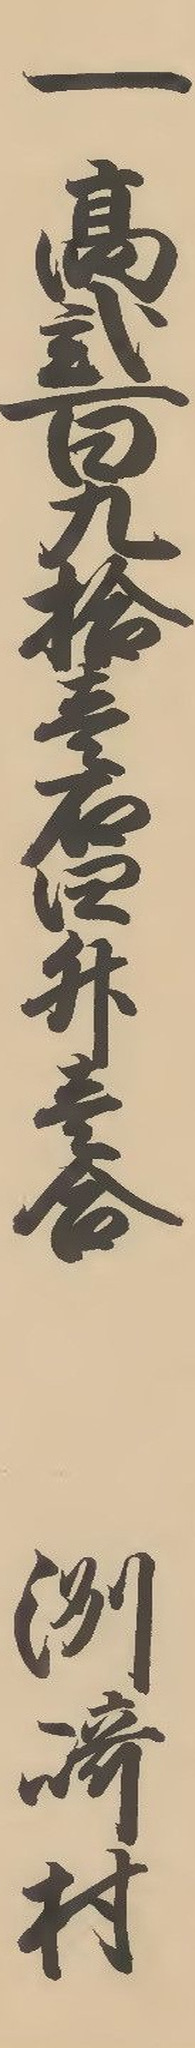一高弐百九拾壱石四升壱合洲崎村
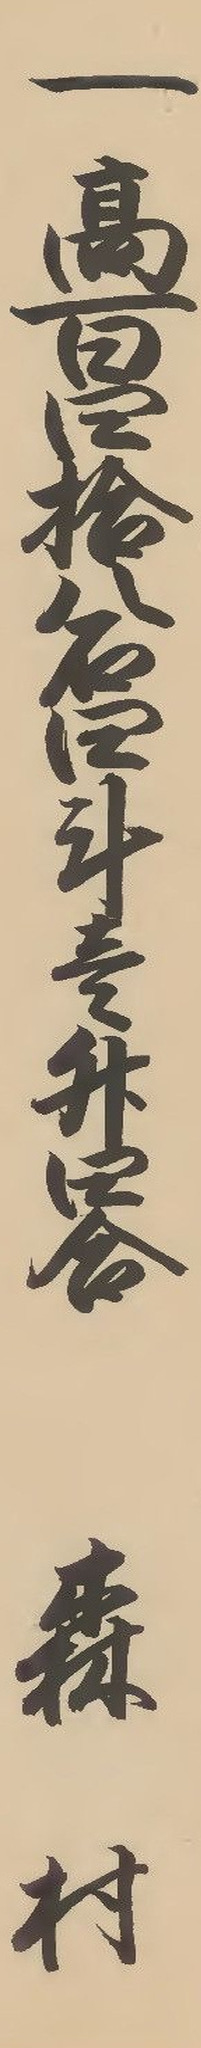一高百四拾八石四斗壱升四合森村
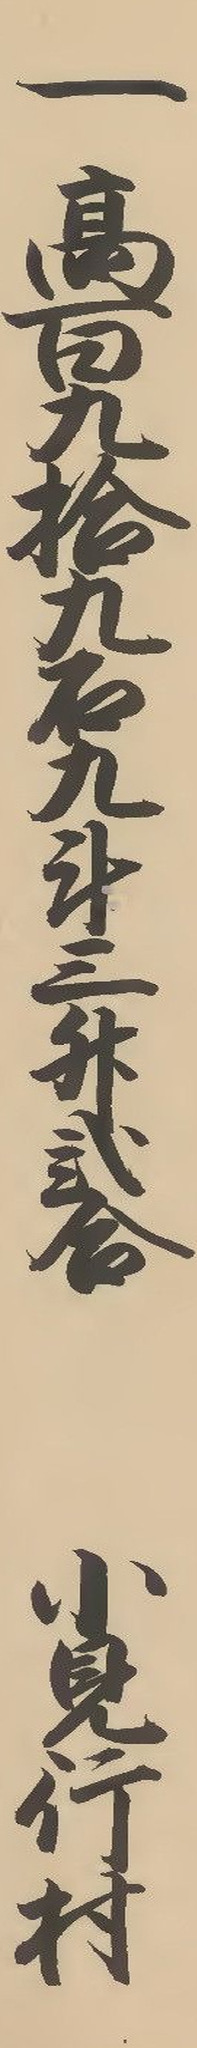一高百九拾九石九斗三升弐合小見行村
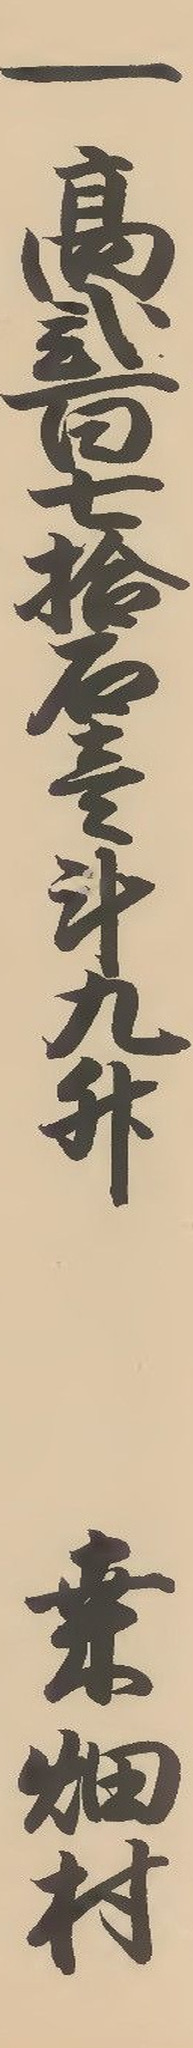一高弐百七拾石壱斗九升桑畑村
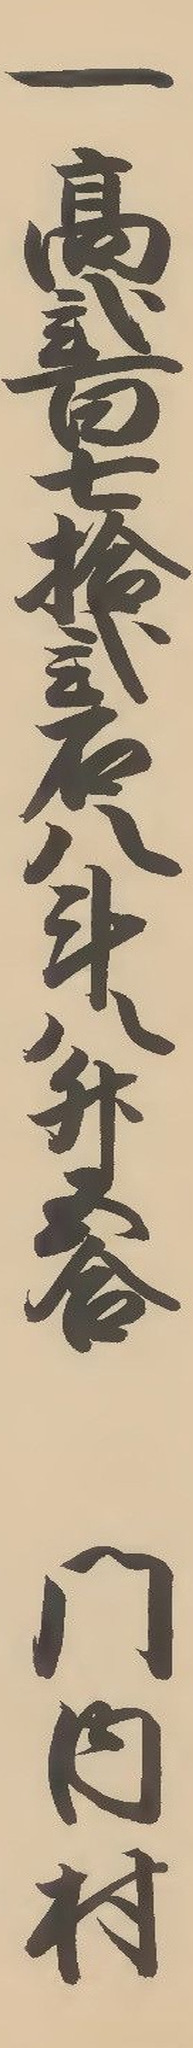一高弐百七拾弐石八斗八升五合門内村
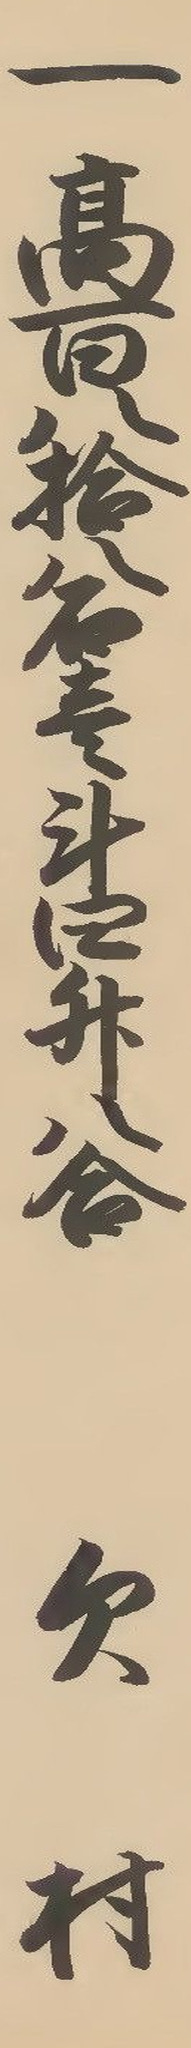一高百八拾八石壱斗四升八合欠村
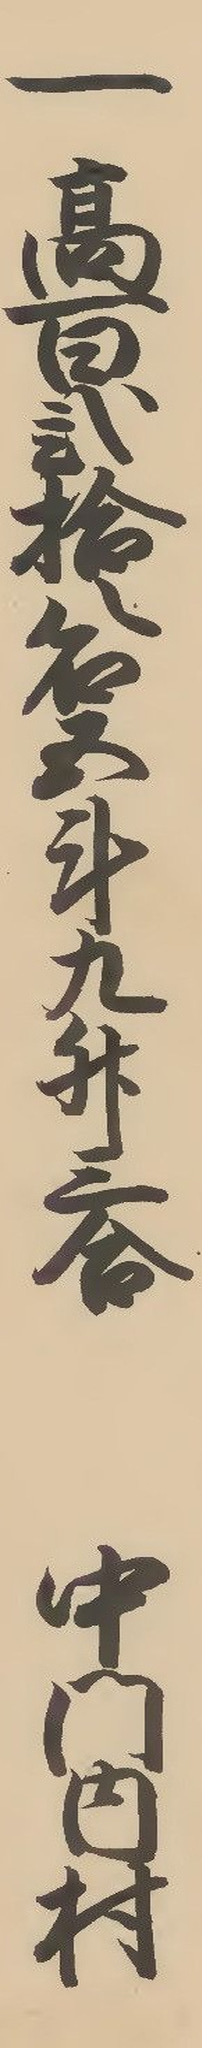一高百弐拾八石五斗九升三合中門内村

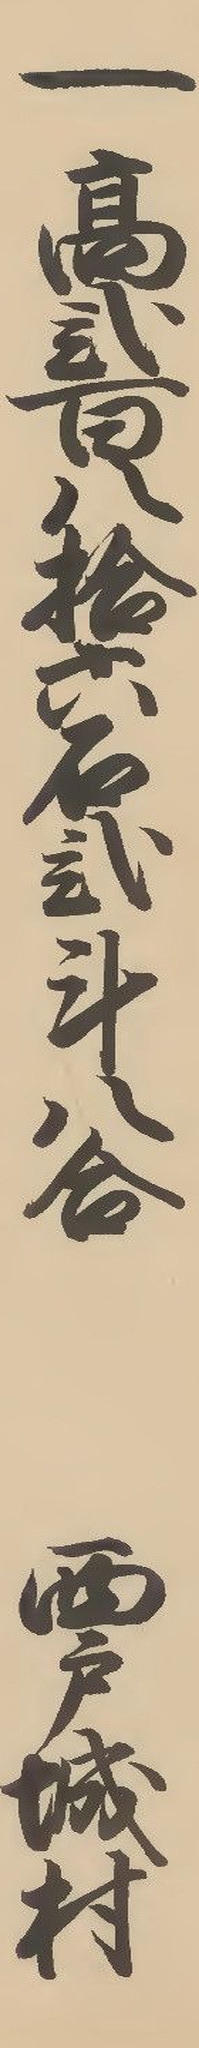一高弐百八拾六石弐斗八合西戸城村
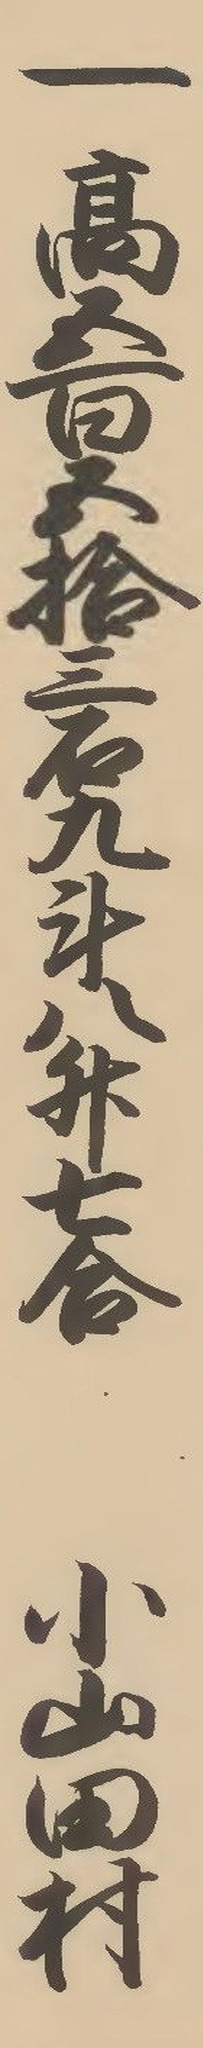一高五百五拾三石九斗八升七合小山田村
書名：三河国郷帳
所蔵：国立公文書館 National Archives of Japan
